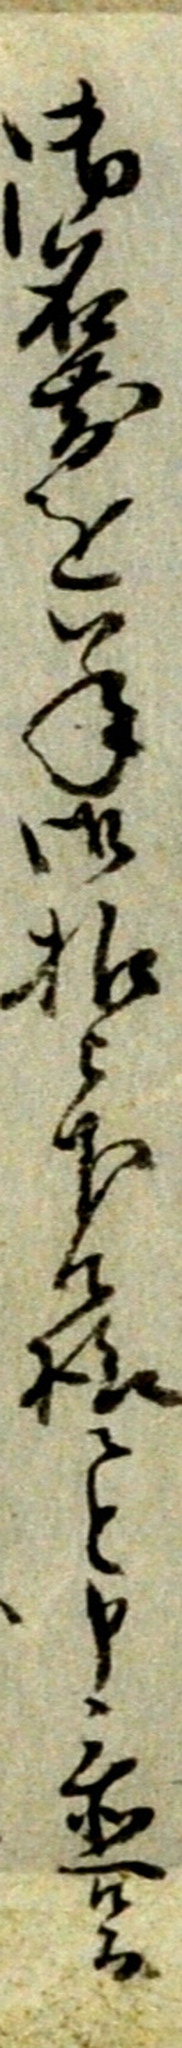御名前を承御扣被下候様ニと申置候而
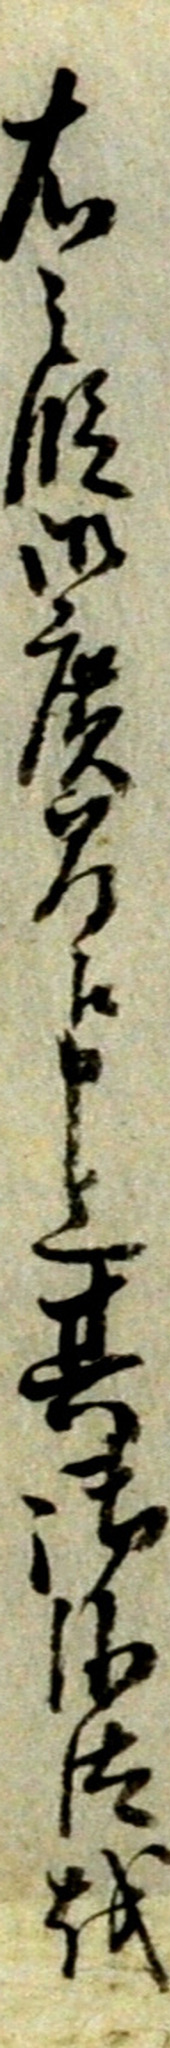右之段御広間江申上其御沙汰越
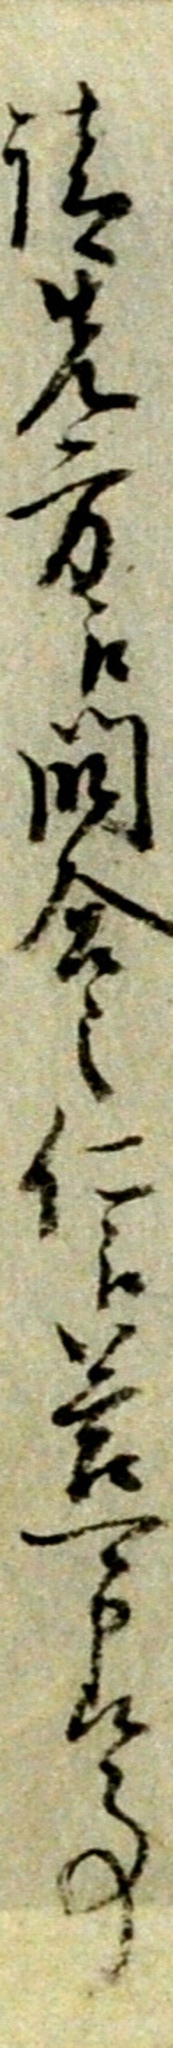請先方江問合之仁江答可申候事
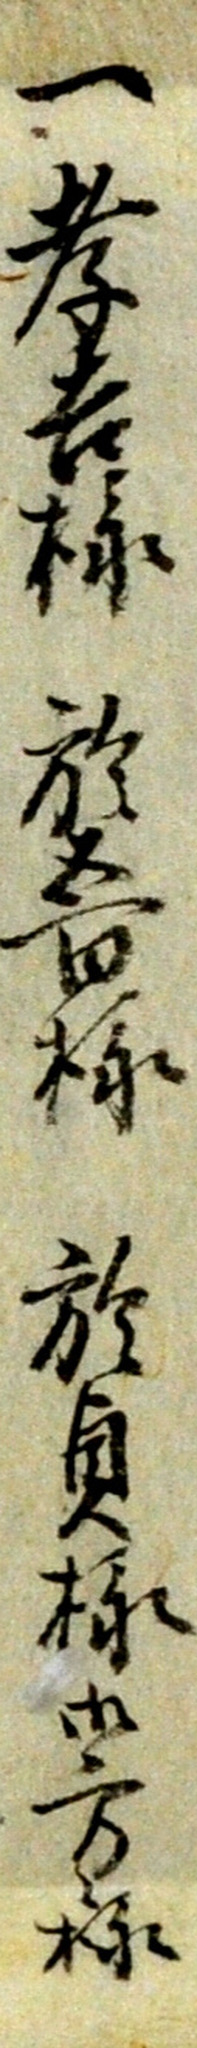一孝吉様於五百様於貞様御方様
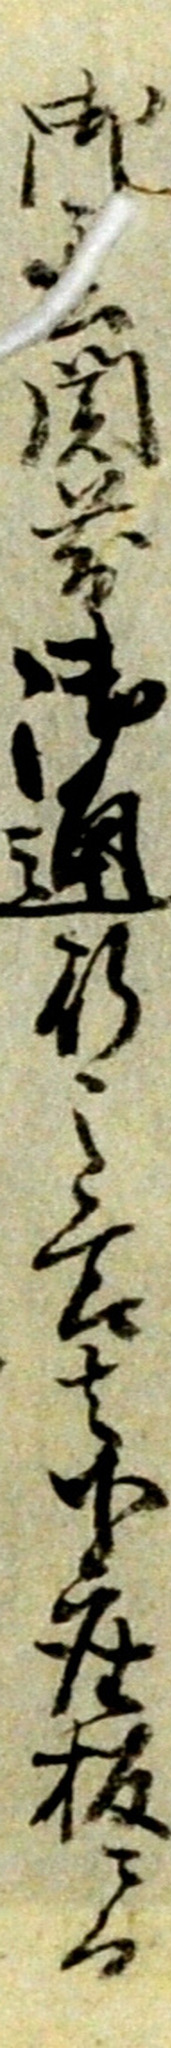御玄関前御通行之節者下座板ニ而
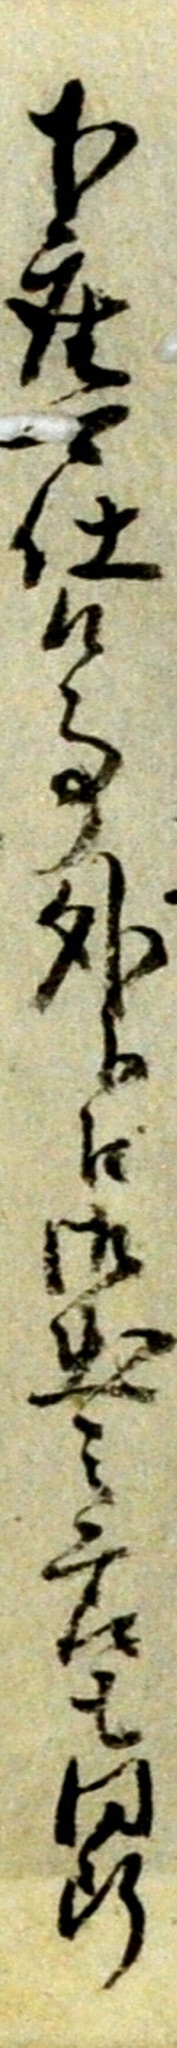下座可仕候事外ト江御出之節も同断
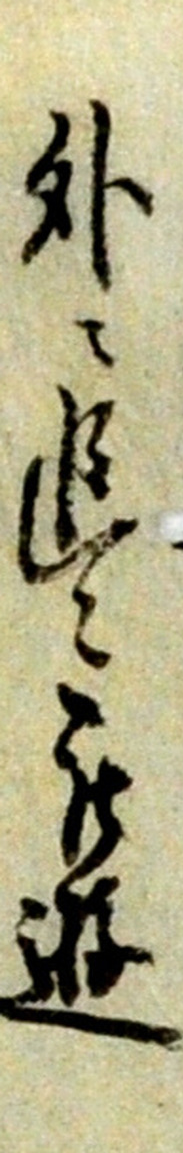外ニ追々罷遊
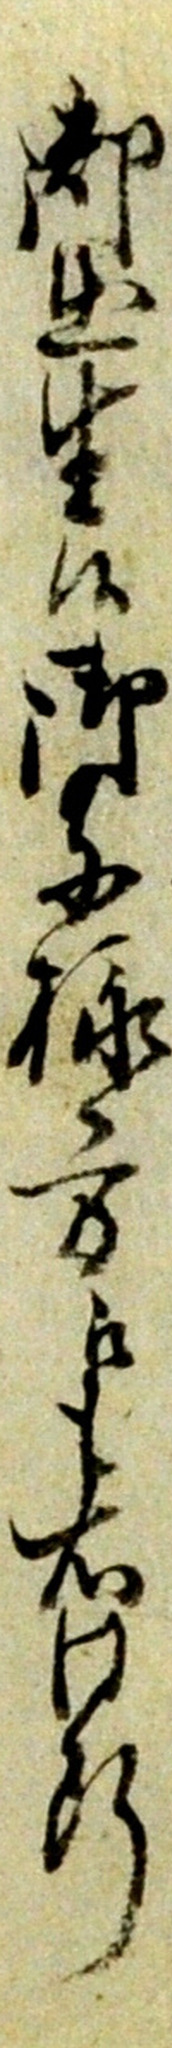御出生候御子様方江も右同断
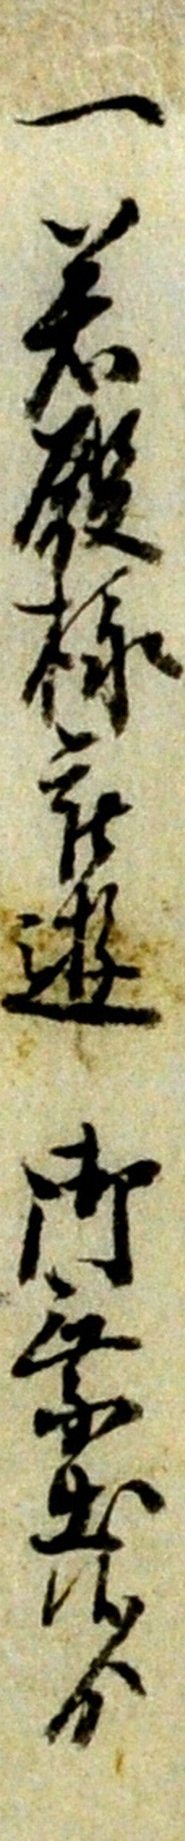一若殿様被遊御乗出候ゟ
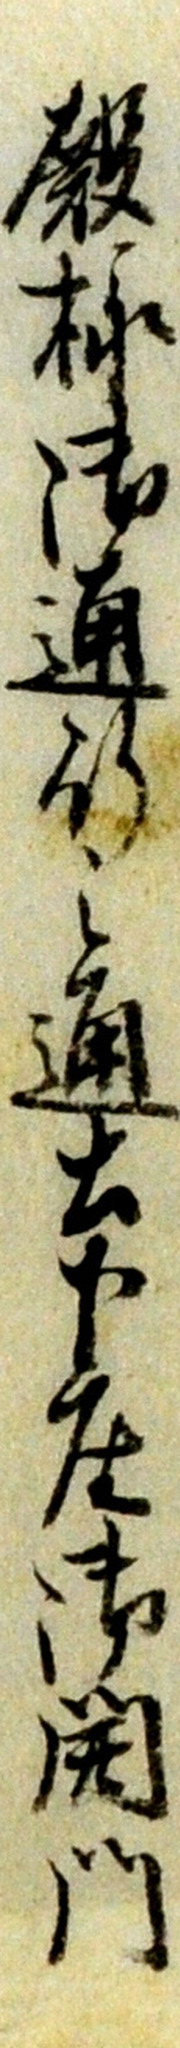殿様御通行之通土下座御開門
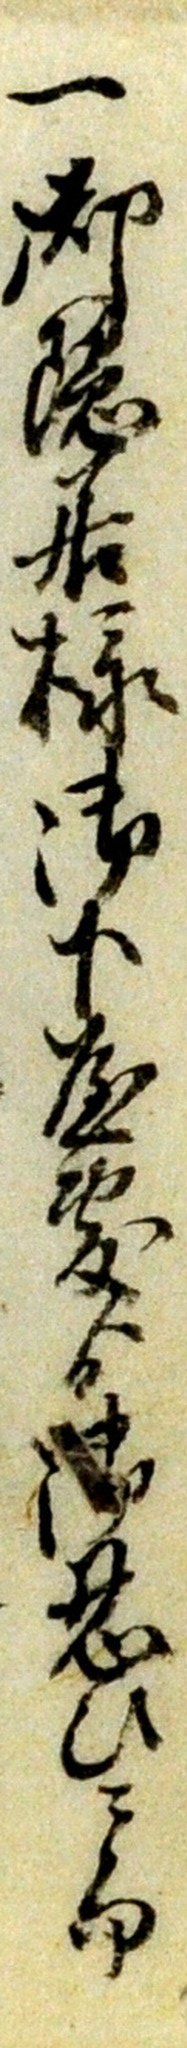一御隠居様御下屋敷ゟ御忍ひニ而
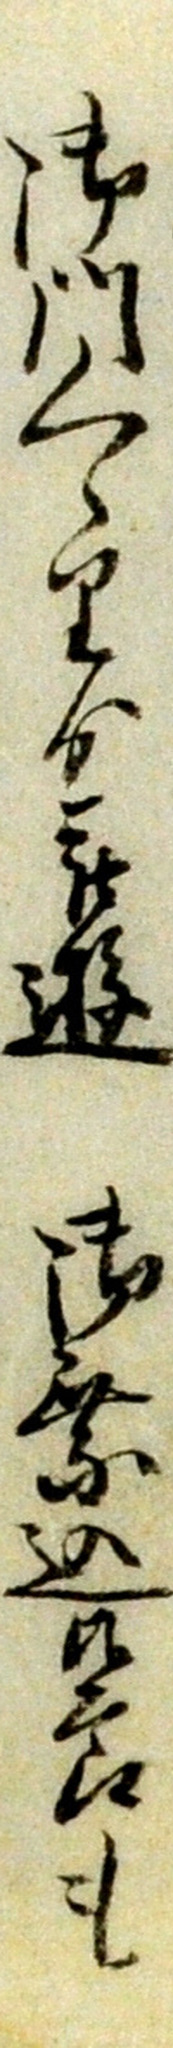御門くくりゟ被遊御乗込候節も
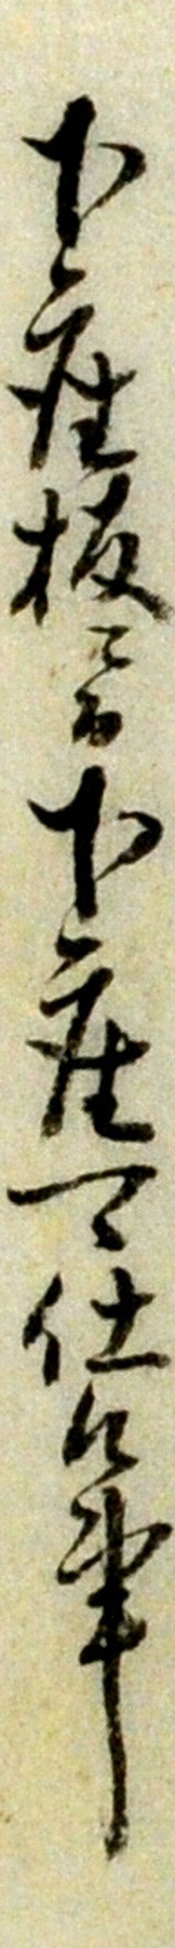下座板ニ而下座可仕候事
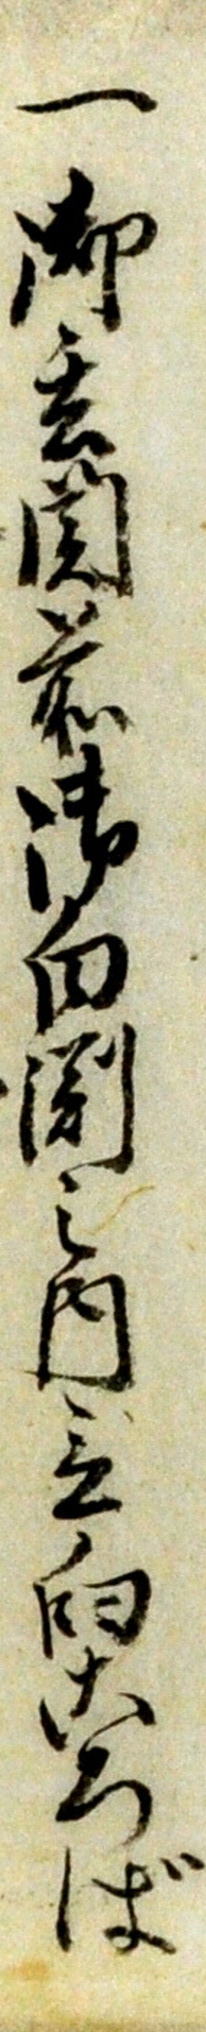一御玄関前御白渕之内言向ころば
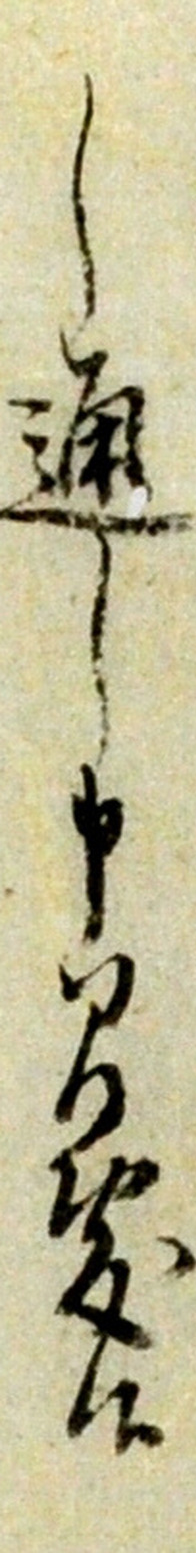し通し申間敷候
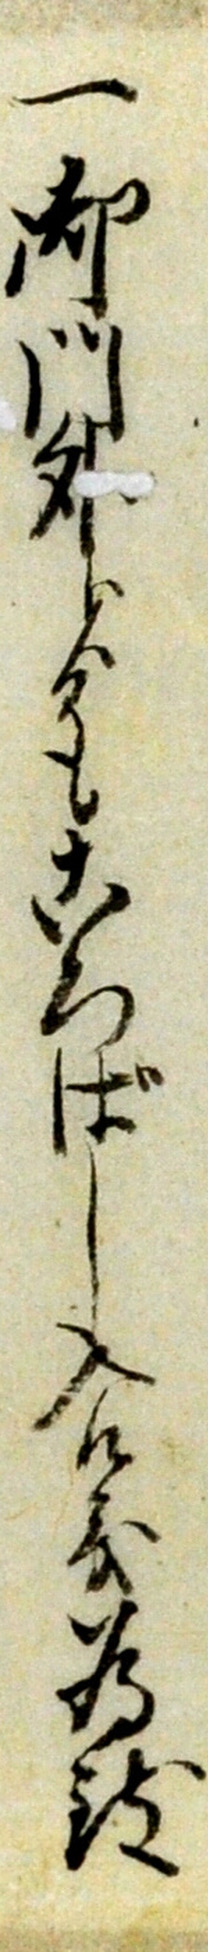一御門外トゟもころばし入候義為致
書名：御先手組江戸御屋敷御門番勤方
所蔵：伊那市立高遠町図書館・合同会社AMANE
